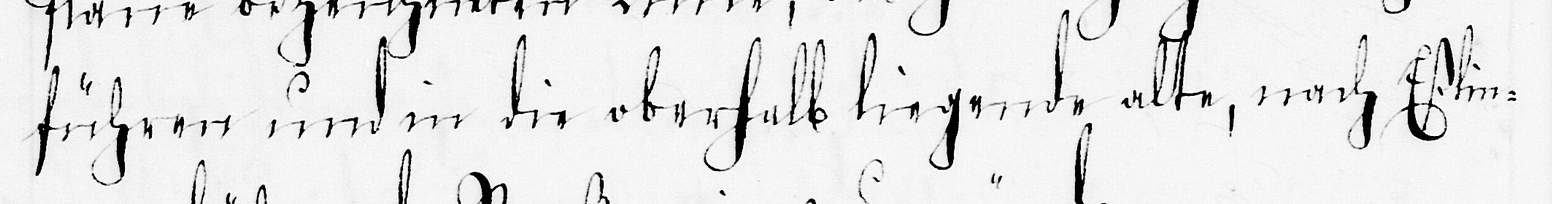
führen und in die oberhalb liegende alte, nach Eßlin¬
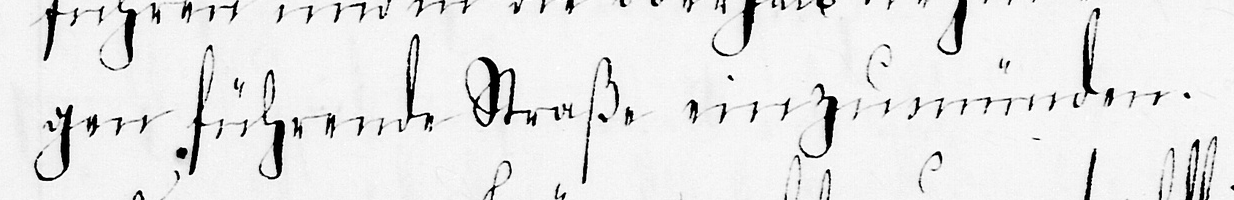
gen führende Straße einzumünden.
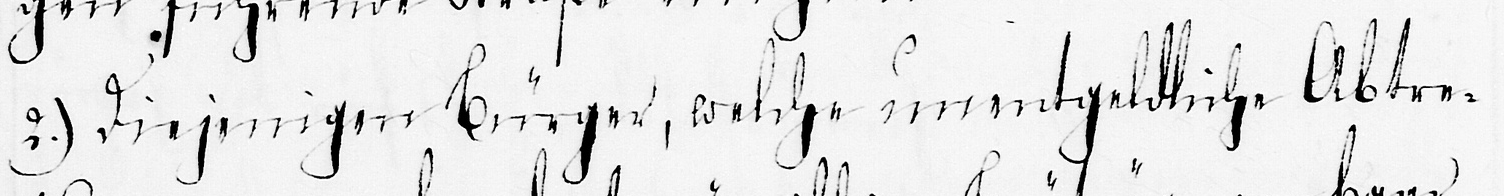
2.) Diejenigen Bürger, welche unentgeldliche Abtre¬
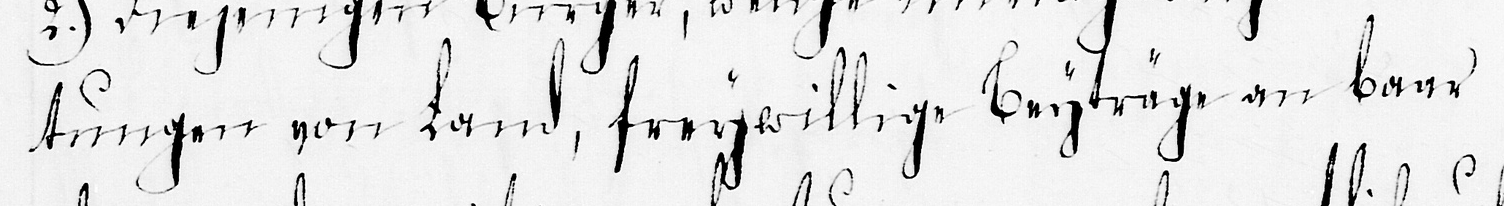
tungen von Land, freywillige Beyträge an baar
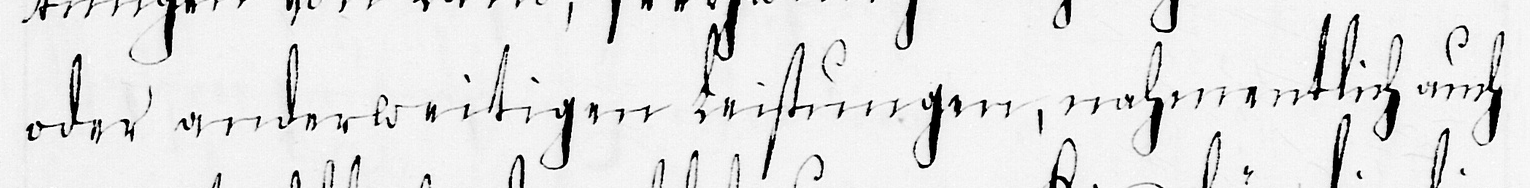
oder anderweitigen Leistungen, nahmentlich auch
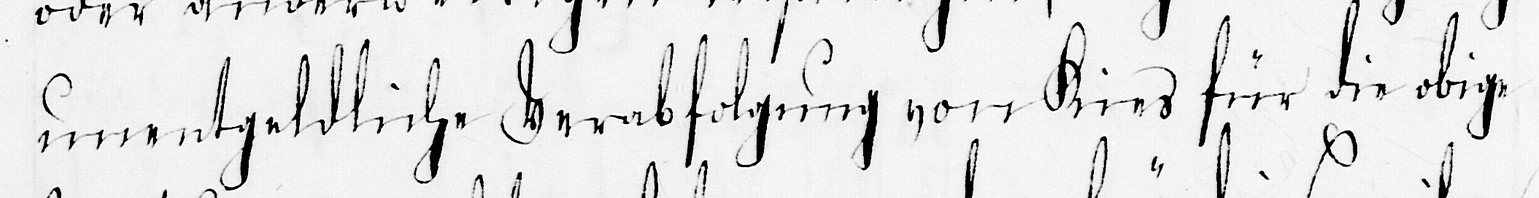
unentgeldliche Verabfolgung von Kies für die obige
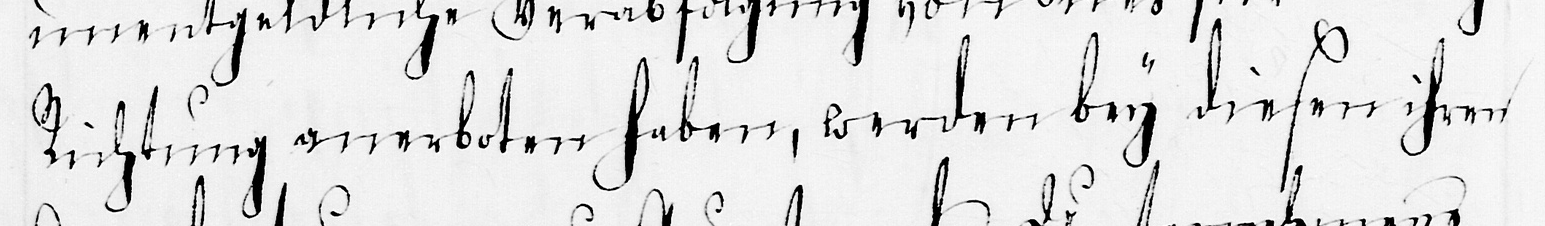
Richtung anerboten haben, werden bey diesen ihren
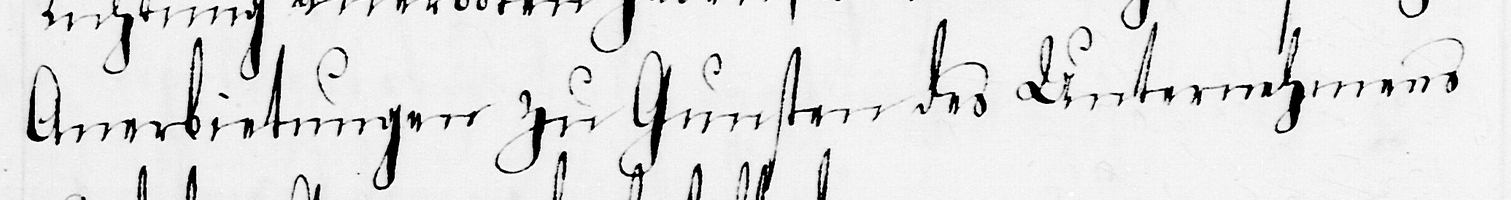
Anerbietungen zu Gunsten des Unternehmens
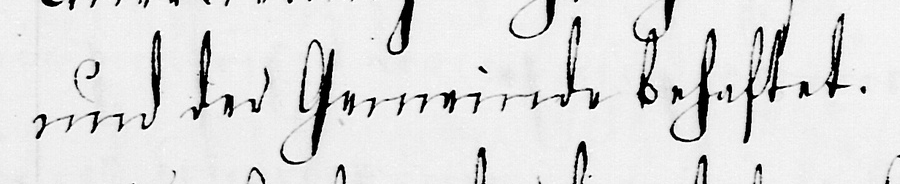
und der Gemeinde behaftet.
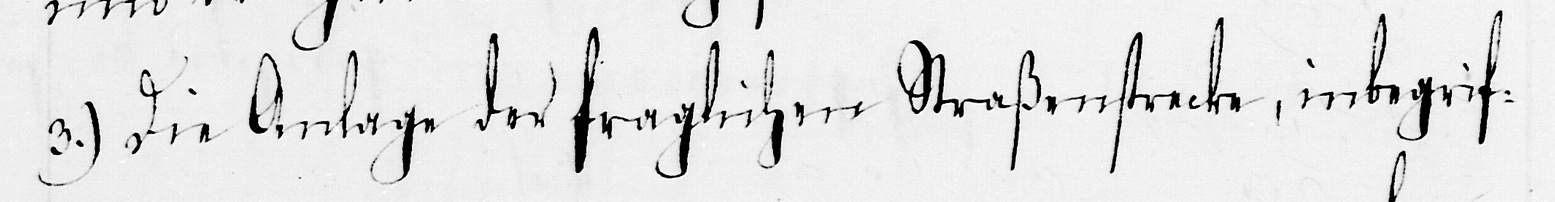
3.) Die Anlage der fraglichen Straßenstrecke, inbegrif-
